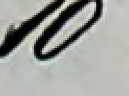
10
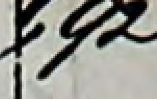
1,92
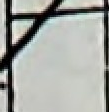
7
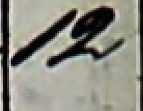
12
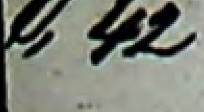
0,42
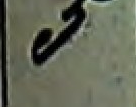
5
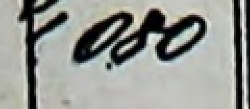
0,080
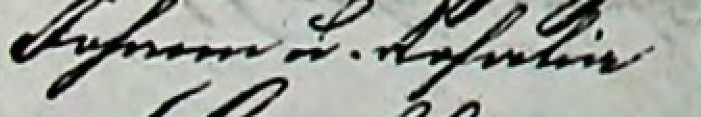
Johann u. Rosalia
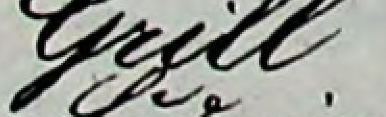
Grill
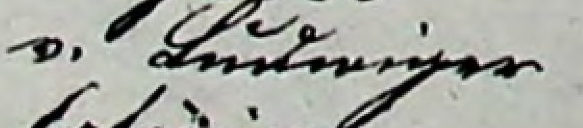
v. Ludwiger
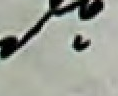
Do
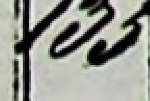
135
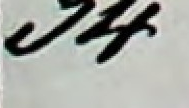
34
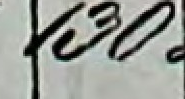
130
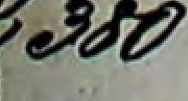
0,380
